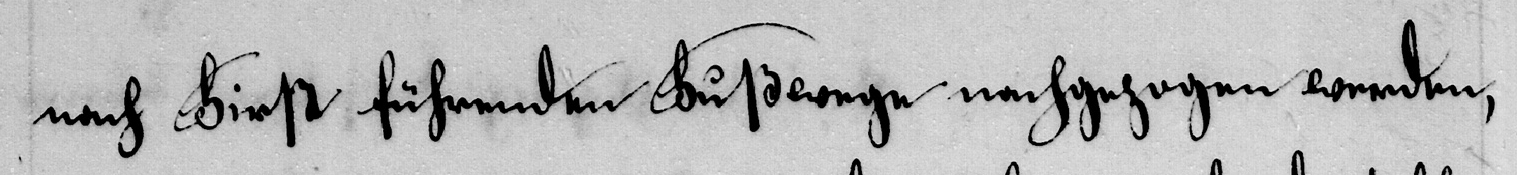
nach First führenden Fußwege nachgezogen werden,
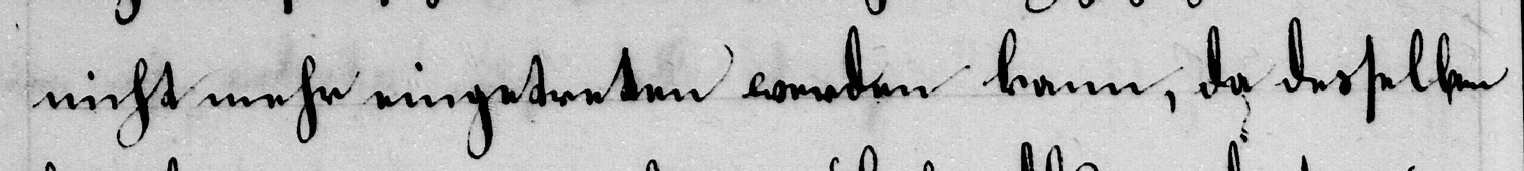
nicht mehr eingetreten werden kann, da dasselbe
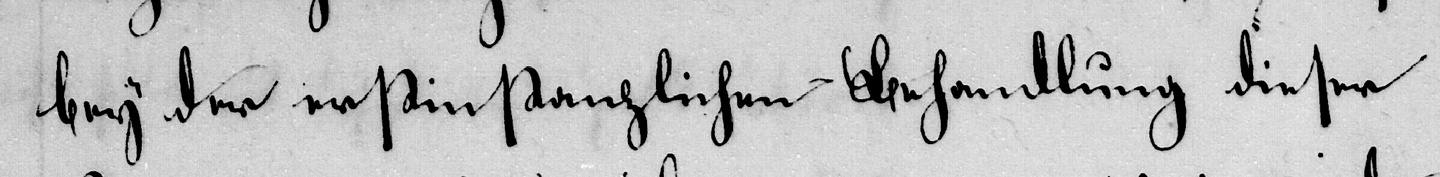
bey der erstinstanzlichen Behandlung dieser
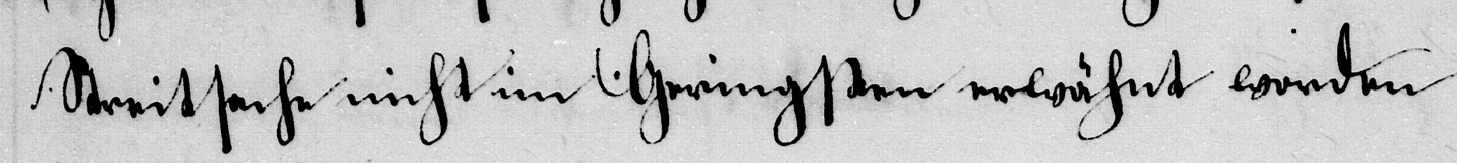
Streitfrage nicht im Geringsten erwähnt worden
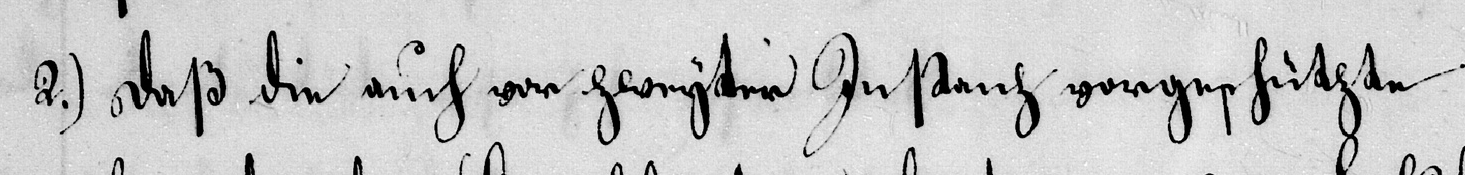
2.) Daß die auch von zweyter Instanz vorgeschützte
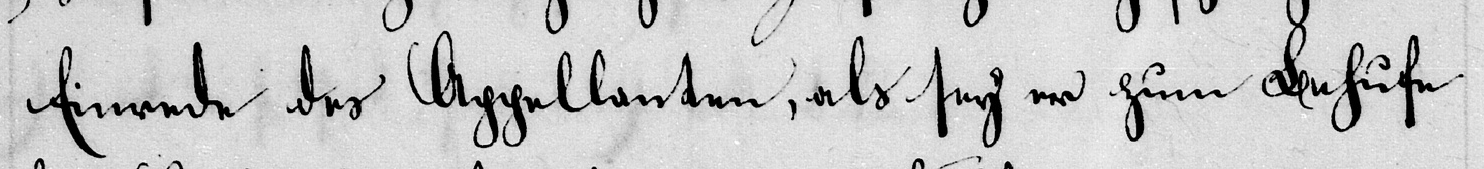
Einrede des Appellanten, als sey er zum Behufe
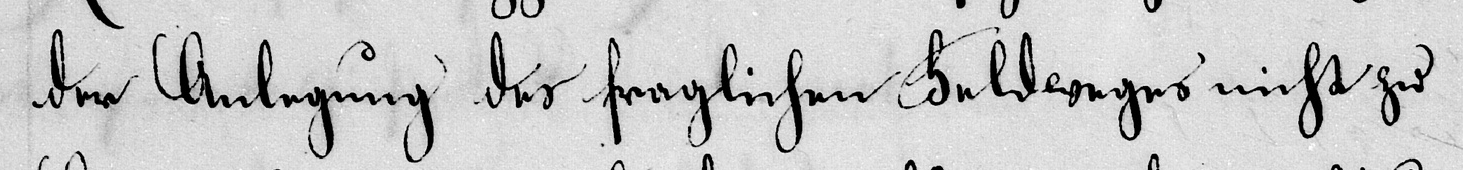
der Anlegung des fraglichen Feldweges nicht zu
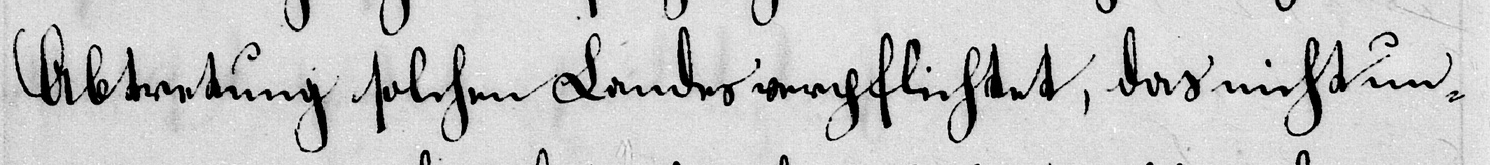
Abtretung solchen Landes verpflichtet, das nicht un¬
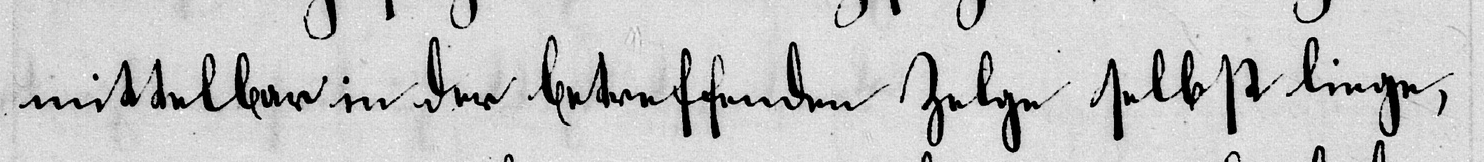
mittelbar in der betreffenden Zelge selbst liege,
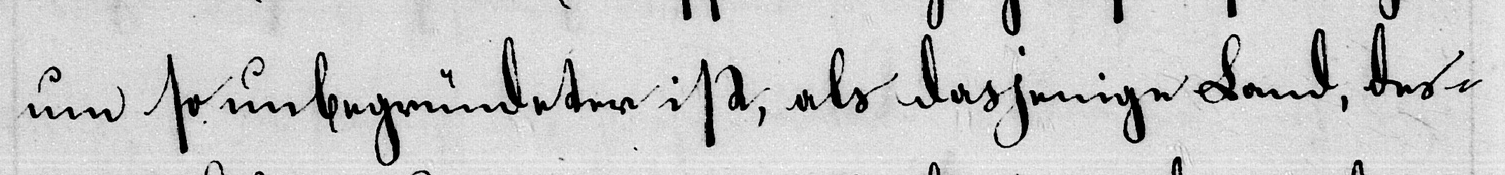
um so unbegründeter ist, als dasjenige Land, des¬
